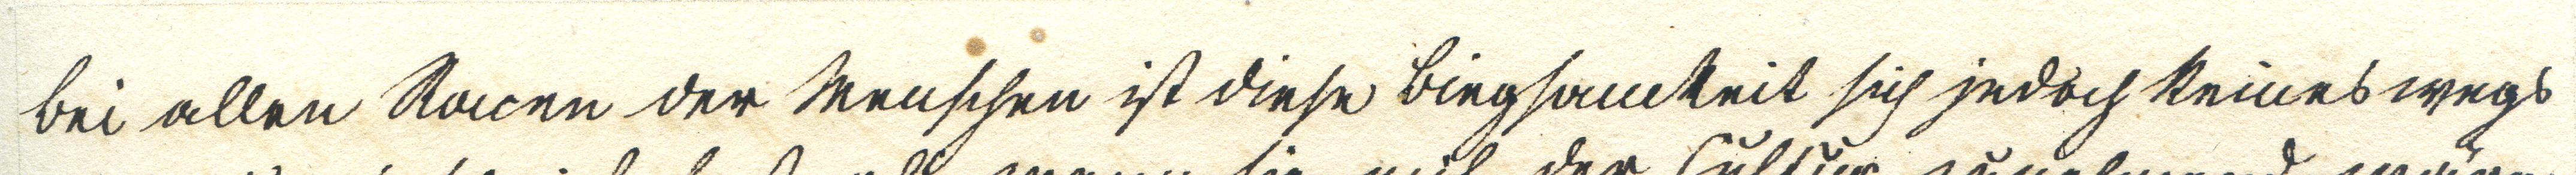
Bei allen Racen der Menschen ist diese Biegsamkeit sich jedoch keineswegs
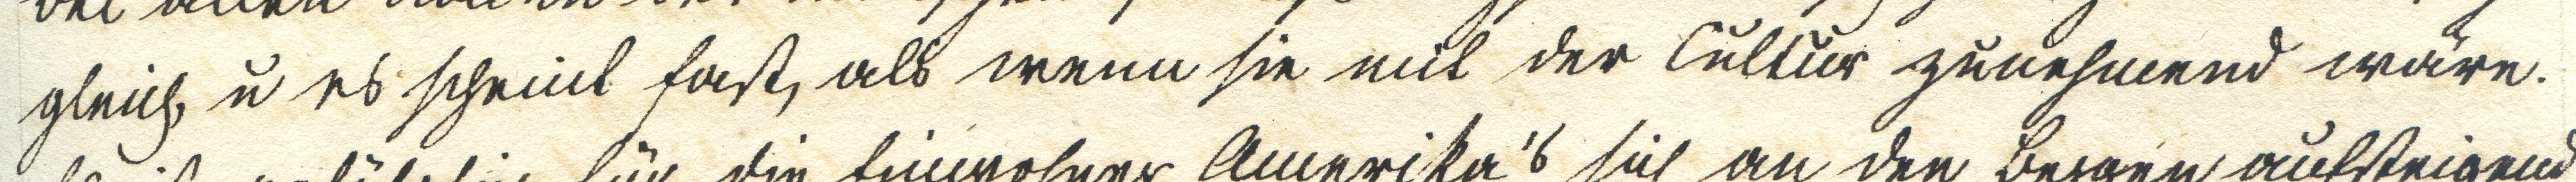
gleich, u es scheint fast, als wenn sie mit der Cultur zunehmend wäre.
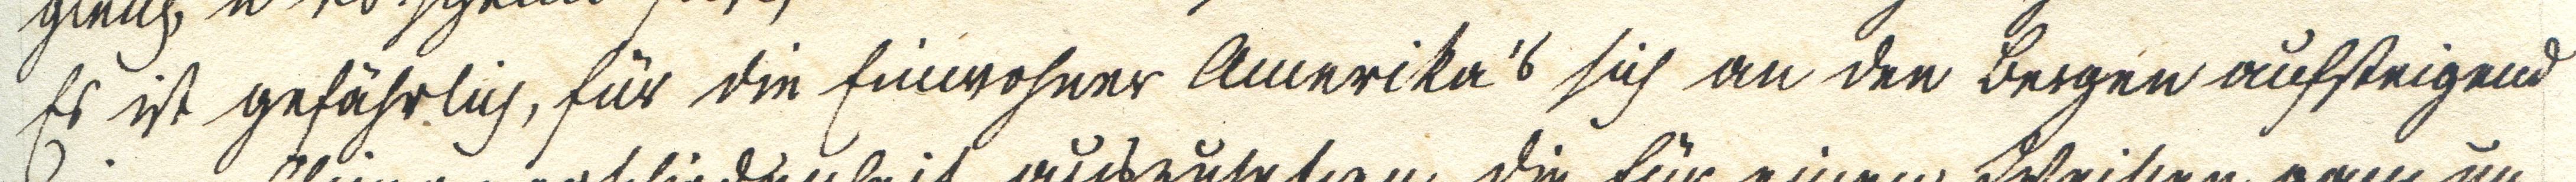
Es ist gefährlich, für die Einwohner Amerika’s sich an den Bergen aufsteigend
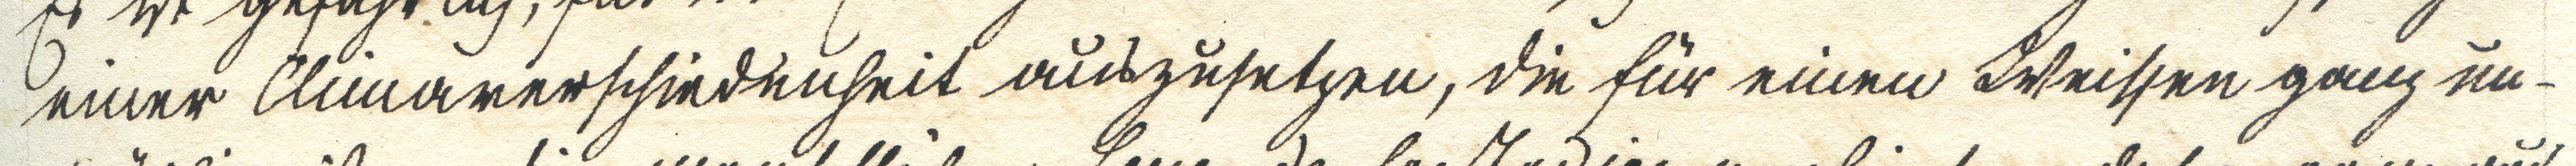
einer Climaverschiedenheit auszusetzen, die für einen Weissen ganz un-
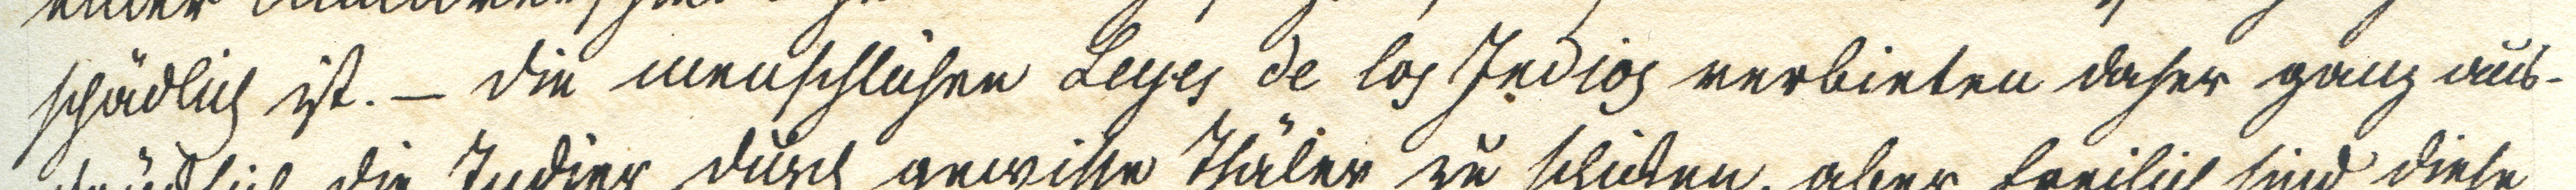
schädlich ist. – Die menschlichen Leyes de los Indios verbieten daher ganz aus-
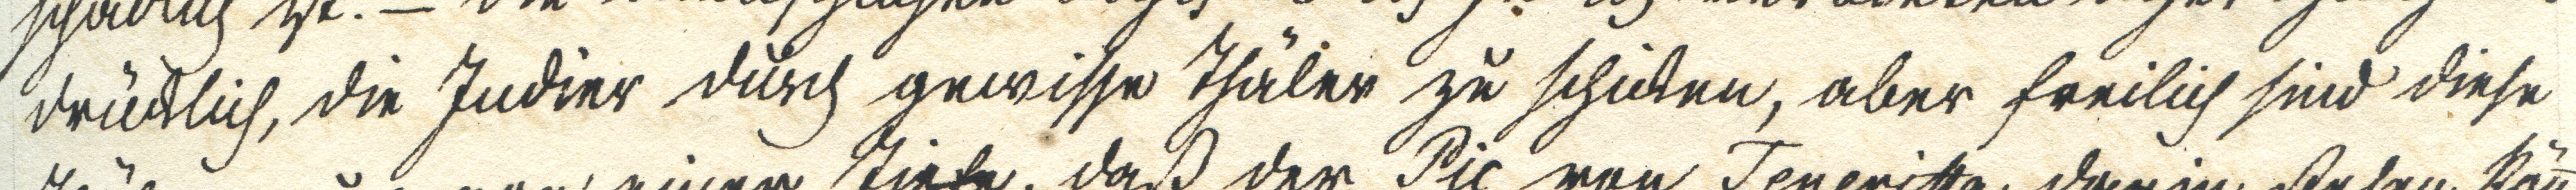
drücklich, die Indier durch gewisse Thäler zu schicken, aber freilich sind diese
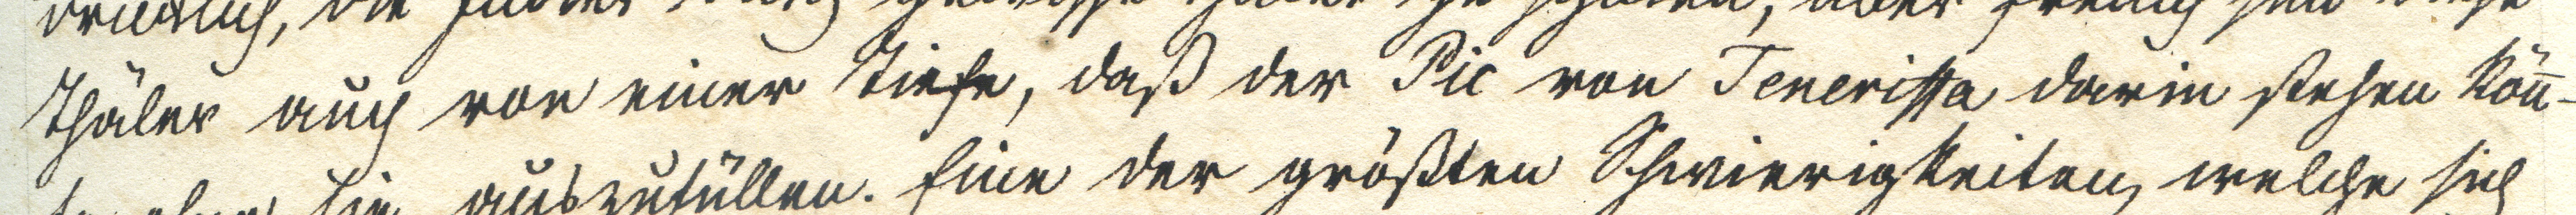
Thäler auch von einer Tiefe, daß der Pic von Teneriffa darin stehen köñ-
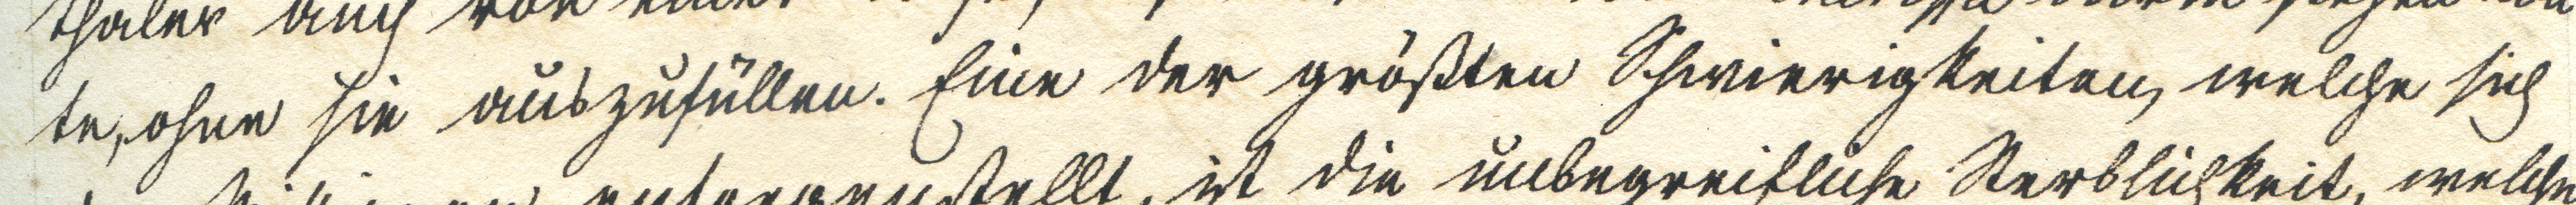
te, ohne sie auszufüllen. Eine der größten Schwierigkeiten, welche sich
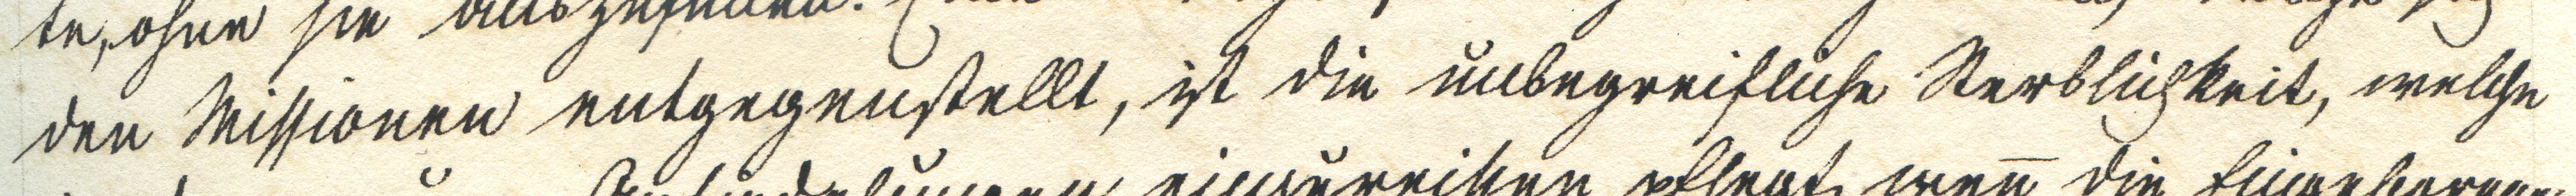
den Missionen entgegenstellt, ist die unbegreifliche Sterblichkeit, welche
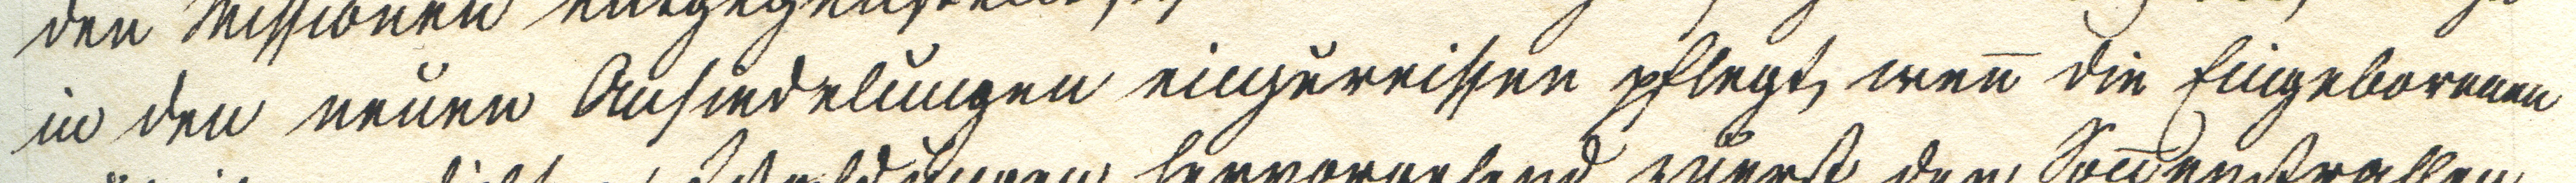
in den neuen Ansiedelungen einzureissen pflegt, weñ die Eingeborenen
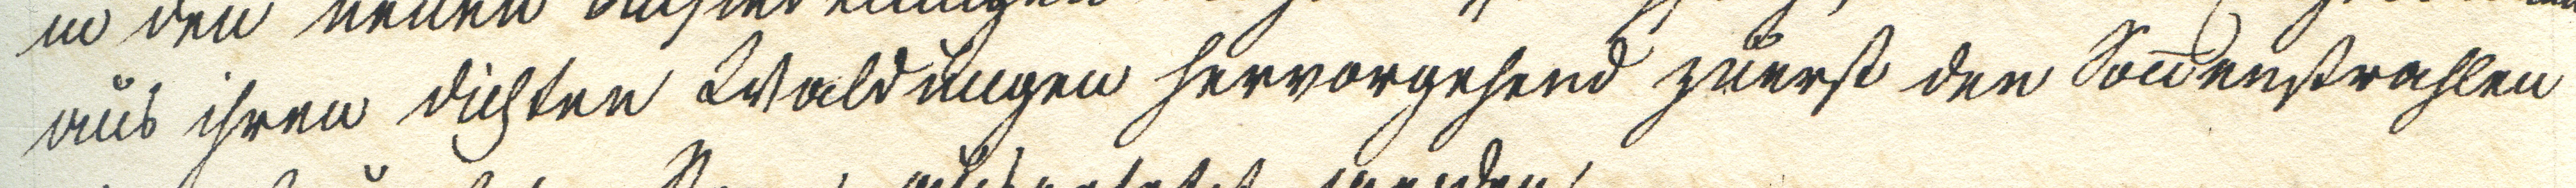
aus ihren dichten Waldungen hervorgehend zuerst den Soñenstrahlen
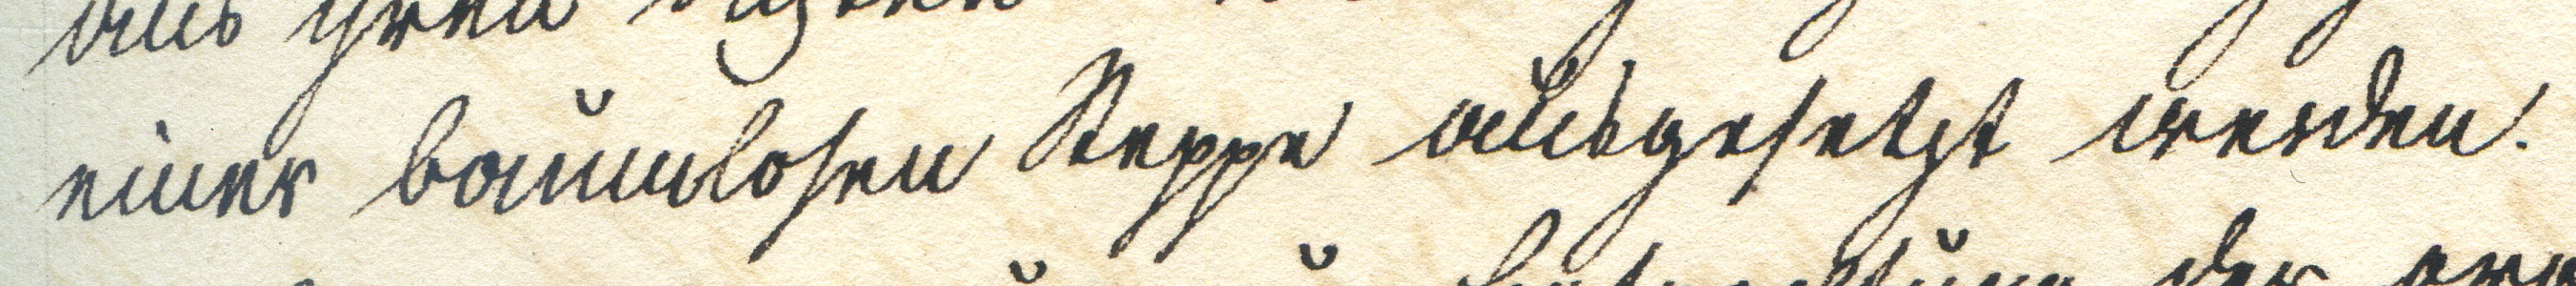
einer baumlosen Steppe ausgesetzt werden.
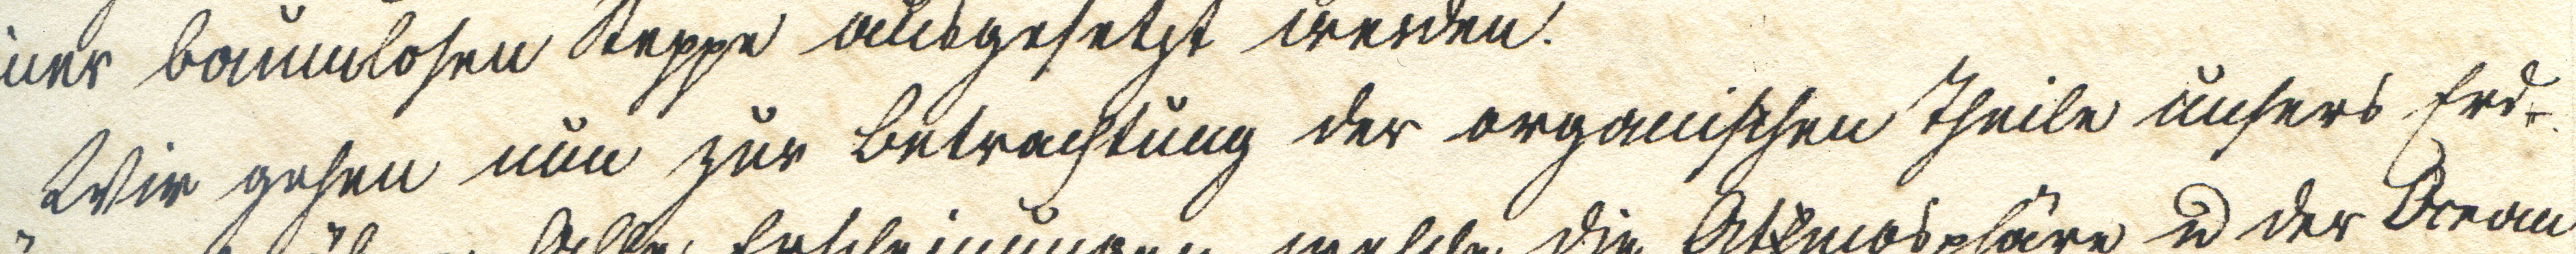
Wir gehen nun zur Betrachtung der organischen Theile unsers Erd-
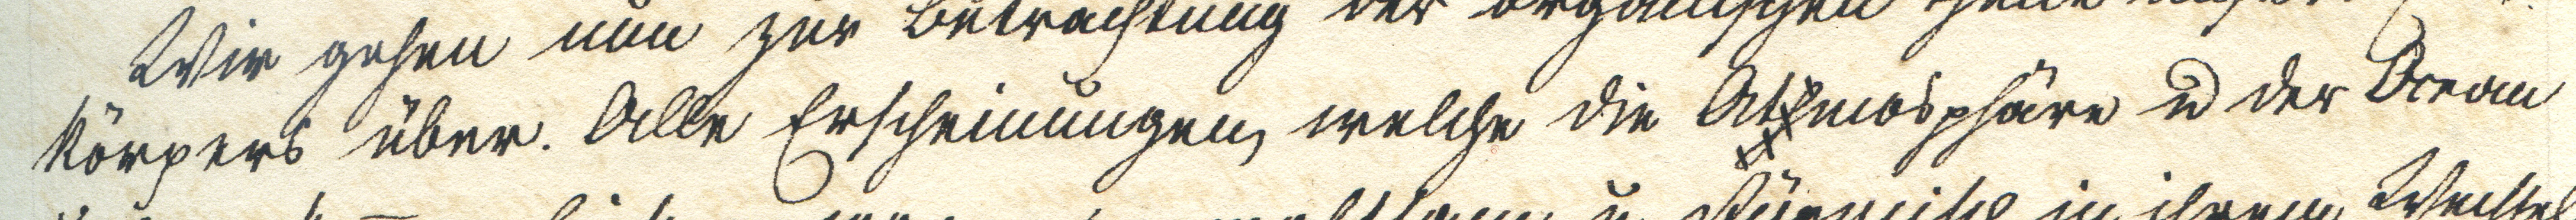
körpers über. Alle Erscheinungen, welche die Athmosphäre u der Ocean
